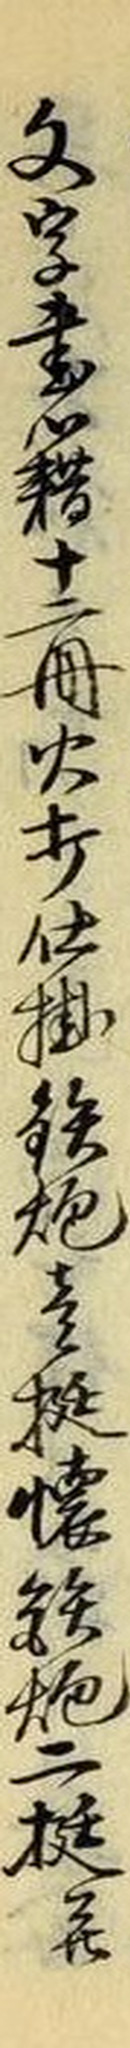文字書籍十二冊火打仕掛鉄炮一挺懐鉄炮ニ挺幷
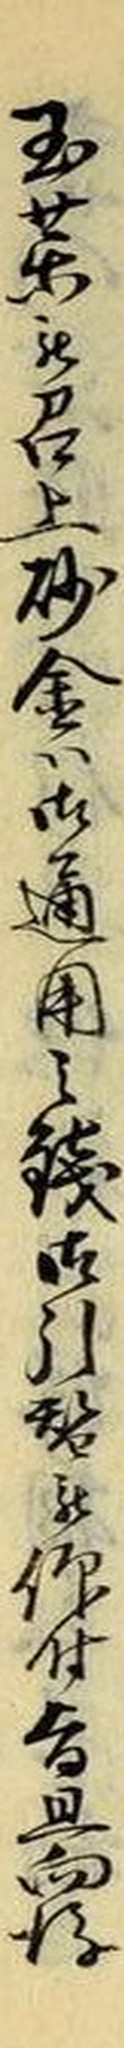玉薬被召上砂金ハ御通用之銭御引替被仰付旨且向後
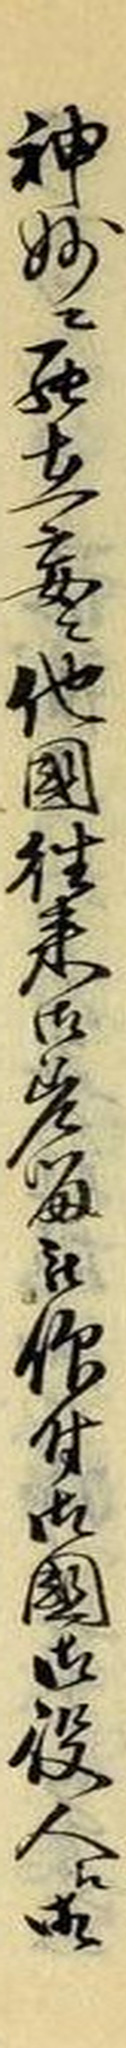神妙ニ罷在妄ニ他国往来御差留被仰付御国御役人江御
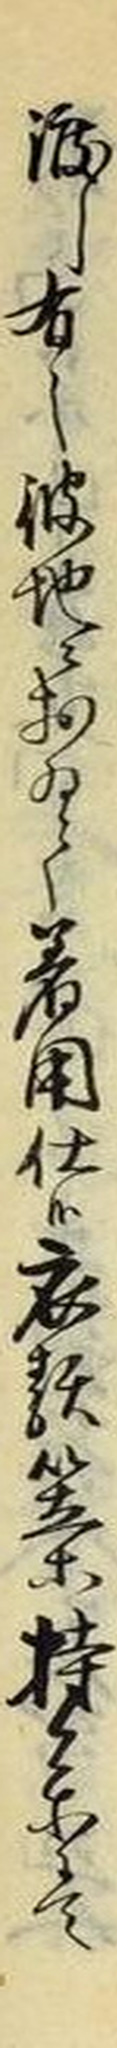渡し有之彼地ニおいて着用仕候衣類笠等持参にて
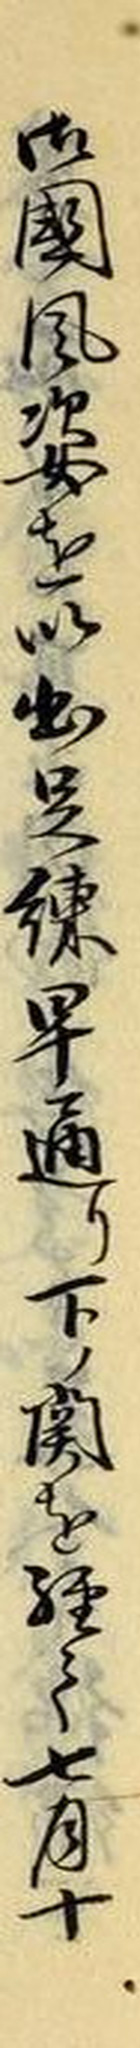御国風姿を以出足諫早通り下ノ関を経て七月十
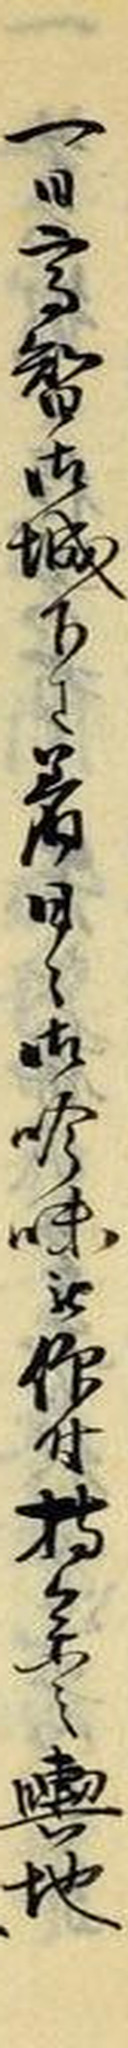一日高智御城下に着日々御吟味被仰付持参之輿地
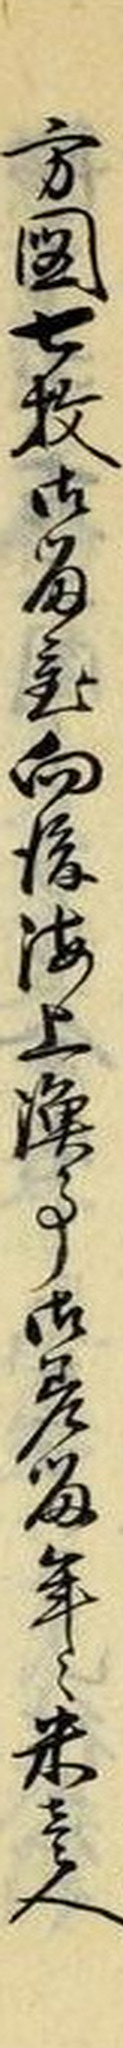方図七枚御留置向後海上漁事御差留年々米一人
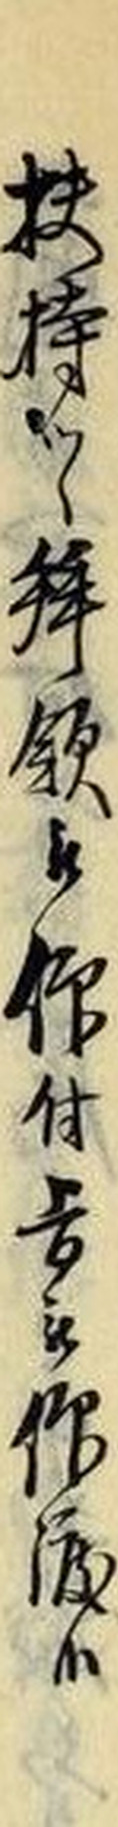扶持ツヽ拝領被仰付旨被仰渡候
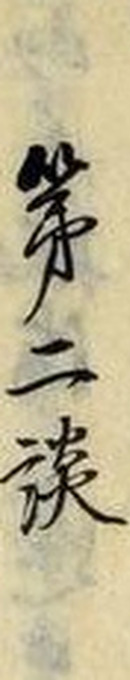第二談
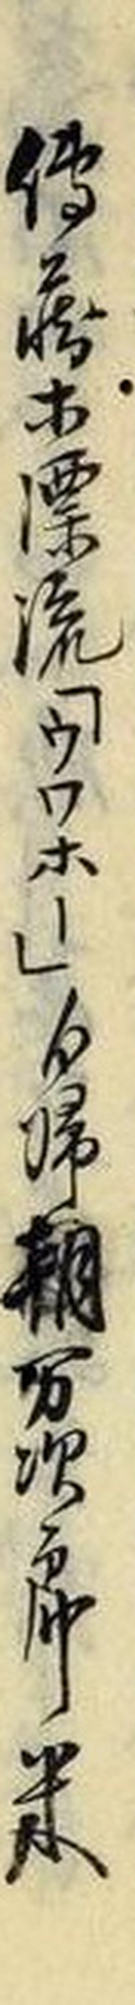傳蔵等漂流「ウワホー」ゟ帰朝万次郎米
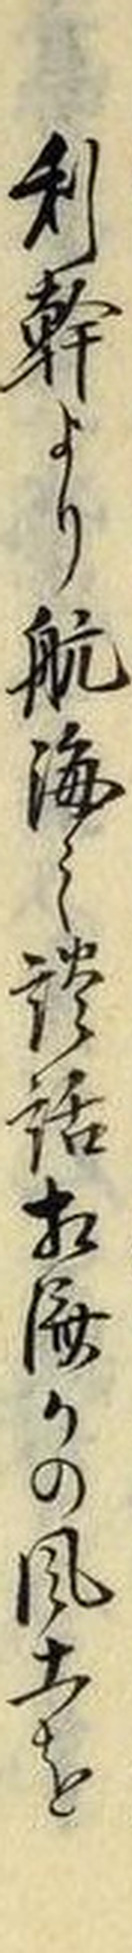利幹より航海之談話相住済かの風土を
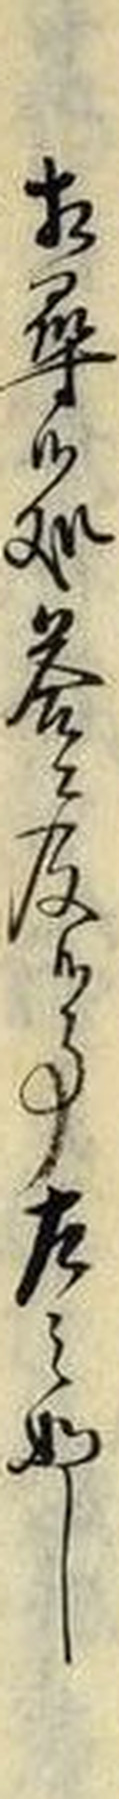相尋候処答二及候事左之如し
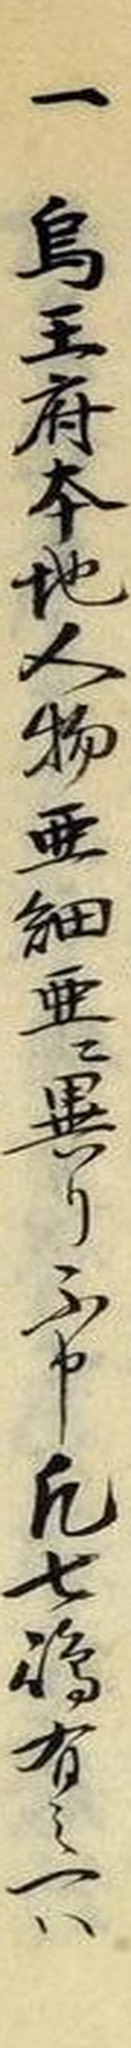一島王府本地人物亜細亜二異り不申凡七嶋有之一ハ
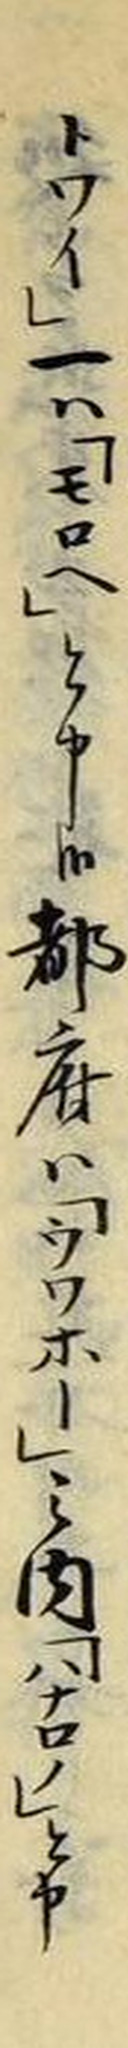トワイ」一ハ「モロへ」と申候都府ハ「ウワホ❙」之内「ハナロノ」と申

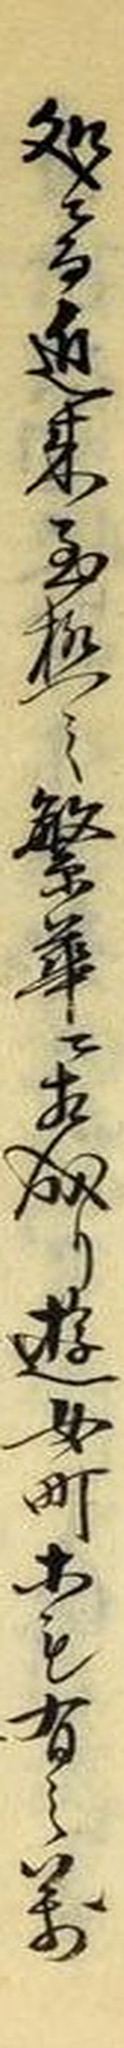処ニ而近来至極之繁華ニ相成り遊女町等も有之万
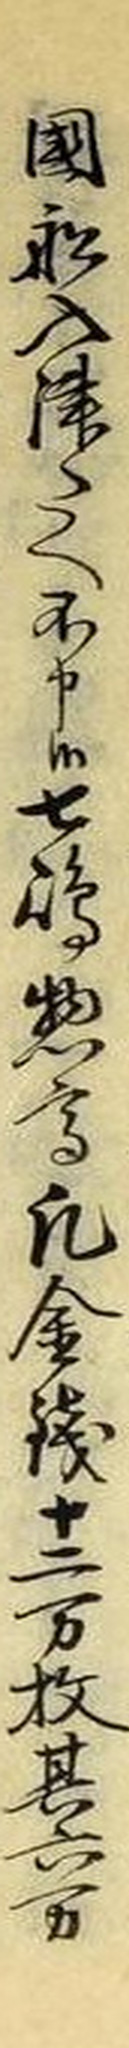国船入津たへ不申候七嶋惣高凡金銭十二万枚其六万
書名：漂客談奇（備考雑録写8）
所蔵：福井県文書館 Fukui Prefectural Archives
